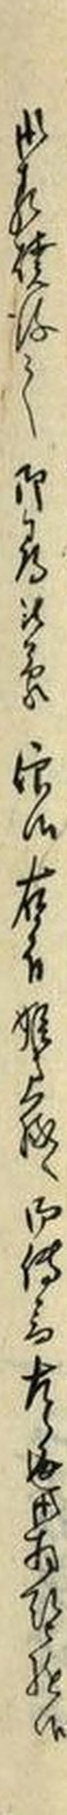御類焼後之御尋被蒙仰候右ニ付姫君様へ御伝ニ而左之通御拝領被遊候
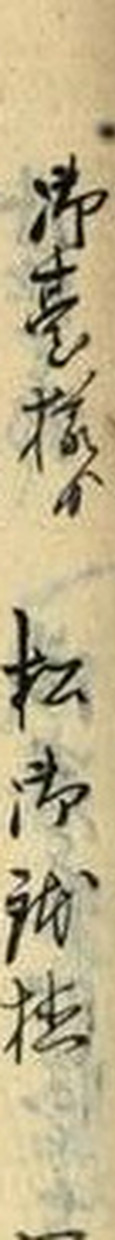御台様ゟ松御鉢植一
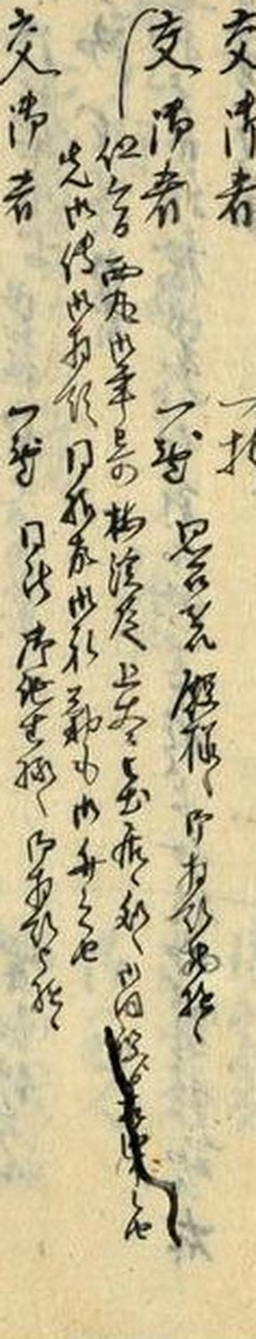但今日西丸御年寄梅淀殿上使ニ被出居候処へ御同役ゟ相廻候由
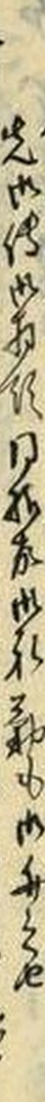先御伝御拝領同様故御礼勤も御文之由
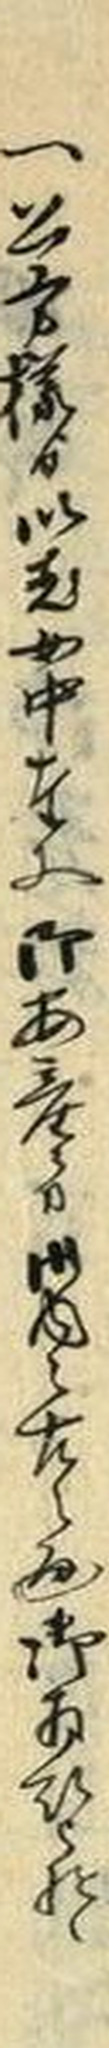一公方様ゟ以老女中奉文御安産ニ付御内々左之通御拝領被遊候
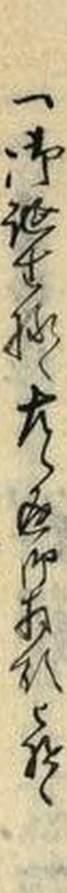一御誕生様へ左之通御拝領被遊候
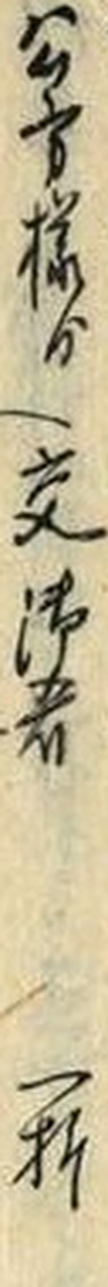公方様ゟ交御肴一折
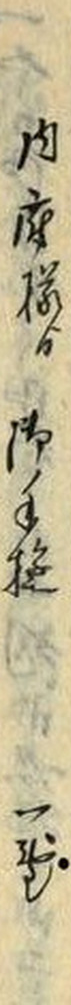内府様ゟ御手遊一台
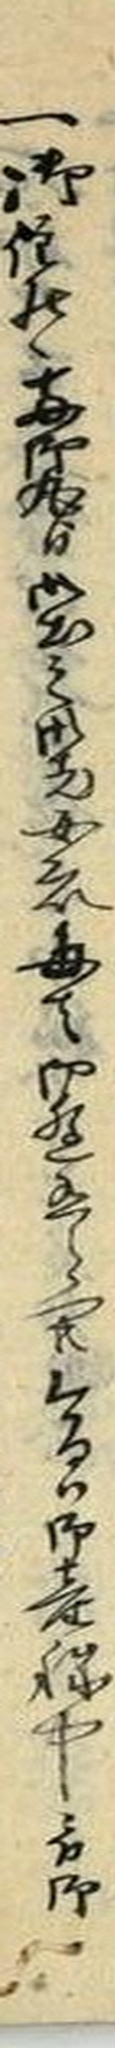一御住居へ両御丸ゟ御出之御老女衆毎は御逢有之候へ共今日ハ御産穢中ニ付御
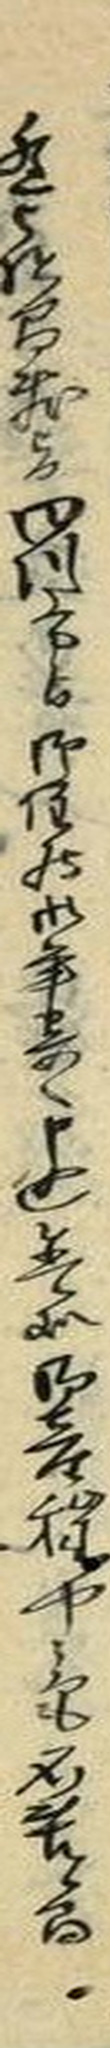逢被遊間敷旨田川方ゟ御住居御年寄へ申込置候処御産穢中ニ而も不苦候間
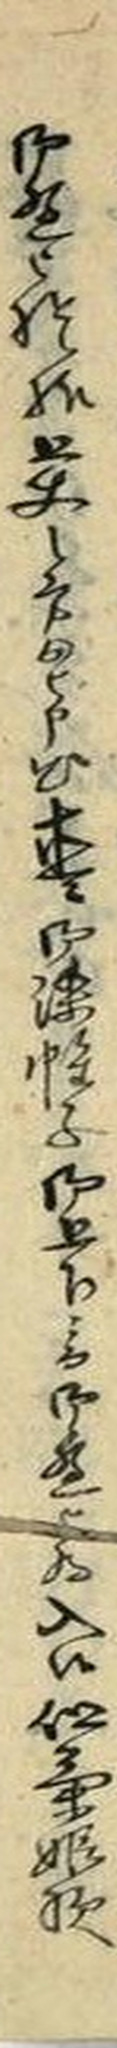御逢被遊候様御使之方ゟ被申出直々御染帷子御上下ニ而御逢被為入候但菊姫様

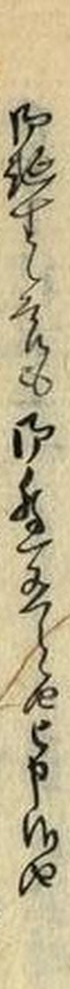御誕生之節も御逢有之候由被申候由
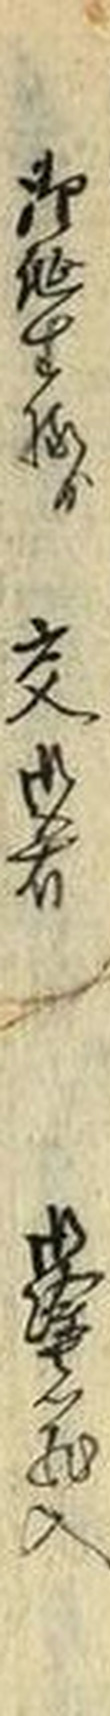御誕生様ゟ交御肴御塗籠入
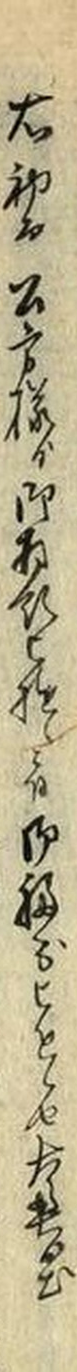右初而公方様ゟ御拝領被遊候ニ付御福分被進候由大奥ゟ出
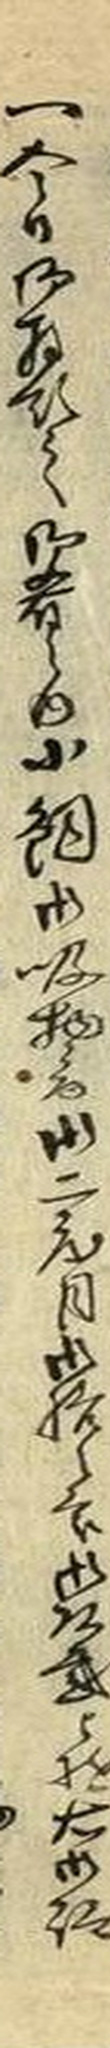一今日御拝領之御肴之内小鯛御吸物ニ而御二度目御膳之節御頂戴被遊右御跡
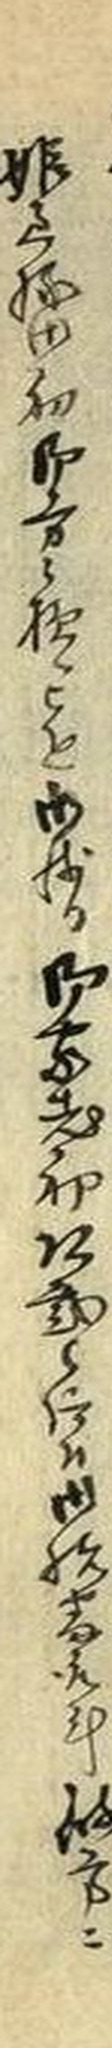姫君様御初御方々様へ被進御残り御家老初頂戴被仰付候御膳番取斗役方ニ
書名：少傅日録抄（斉承付側向頭取日記、在府）
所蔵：福井県文書館 Fukui Prefectural Archives
